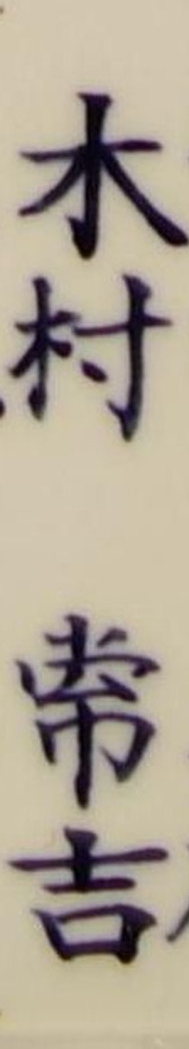木村常吉
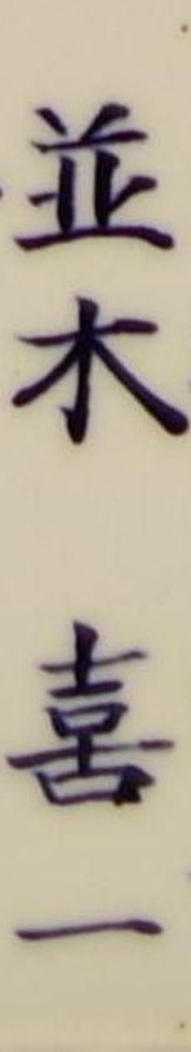並木喜一
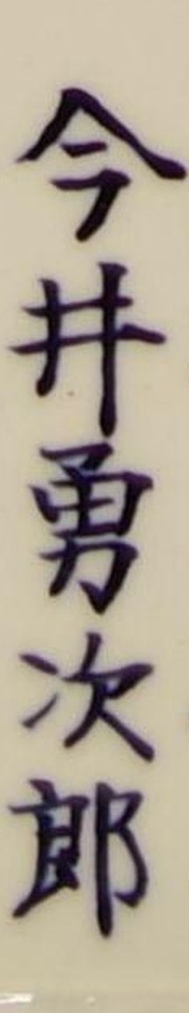今井勇次郎
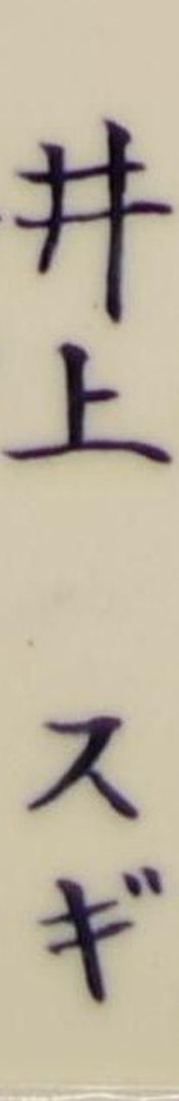井上スギ
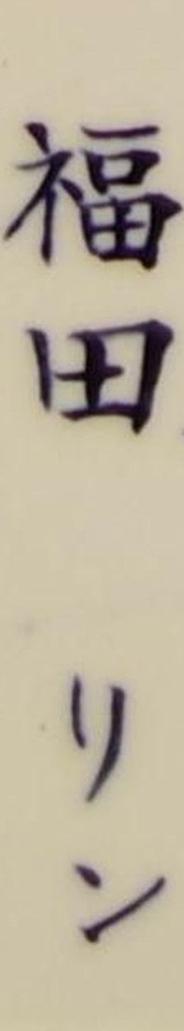福田リン
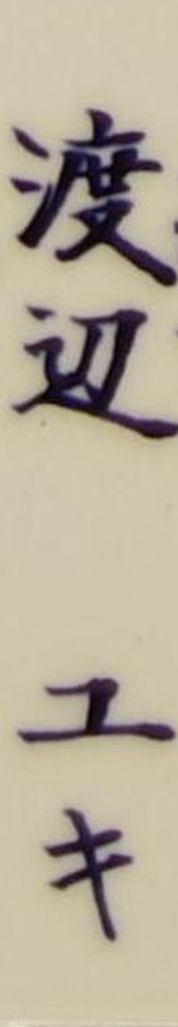渡辺ユキ
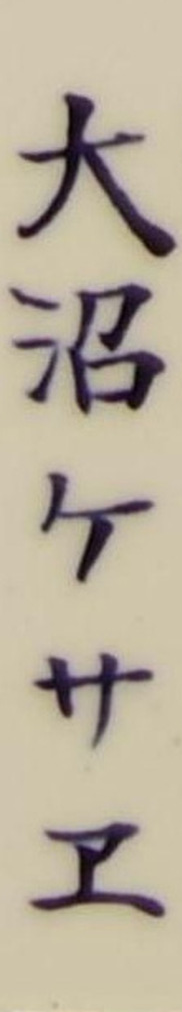大沼ケサヱ
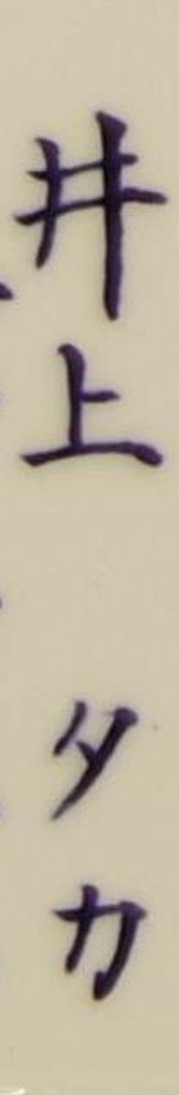井上タカ
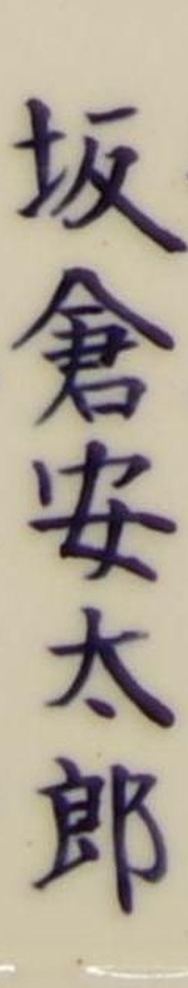坂倉安太郎
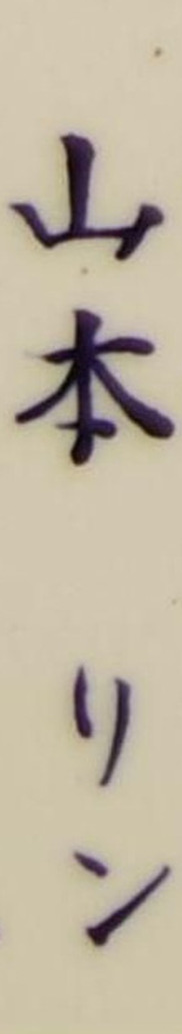山本リン
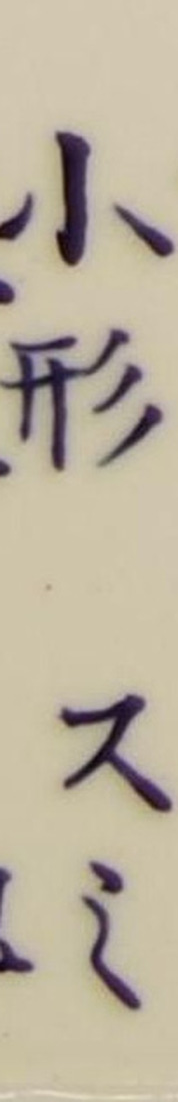小形スミ
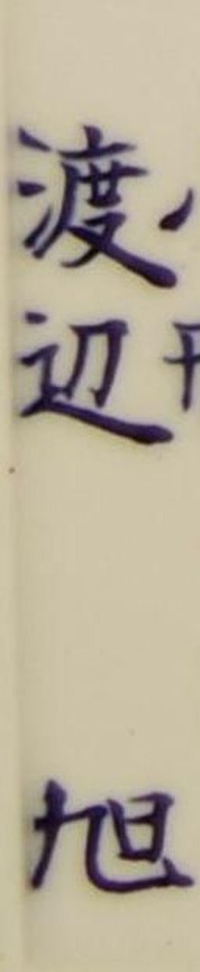渡辺旭

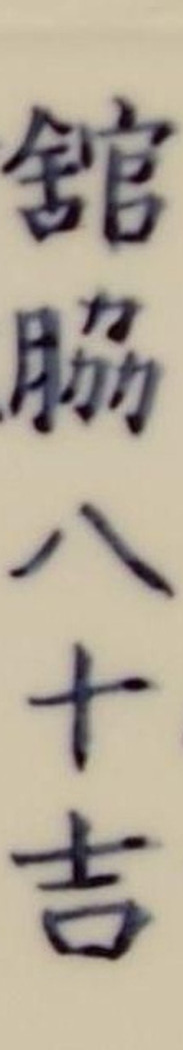館脇八十吉
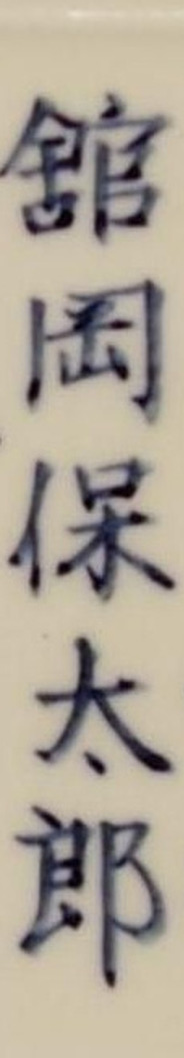館岡保太郎
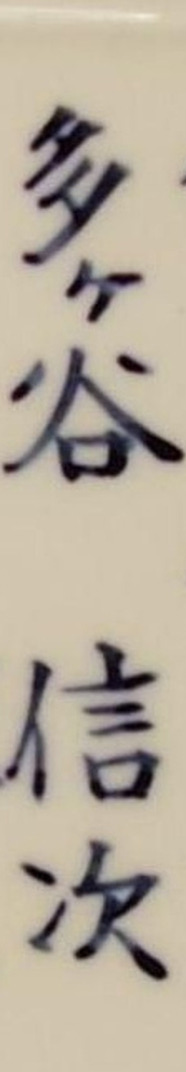多ヶ谷信次
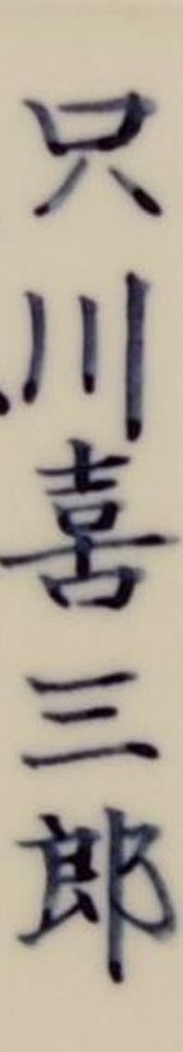只川喜三郎
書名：E~L
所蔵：高野山金剛峯寺
